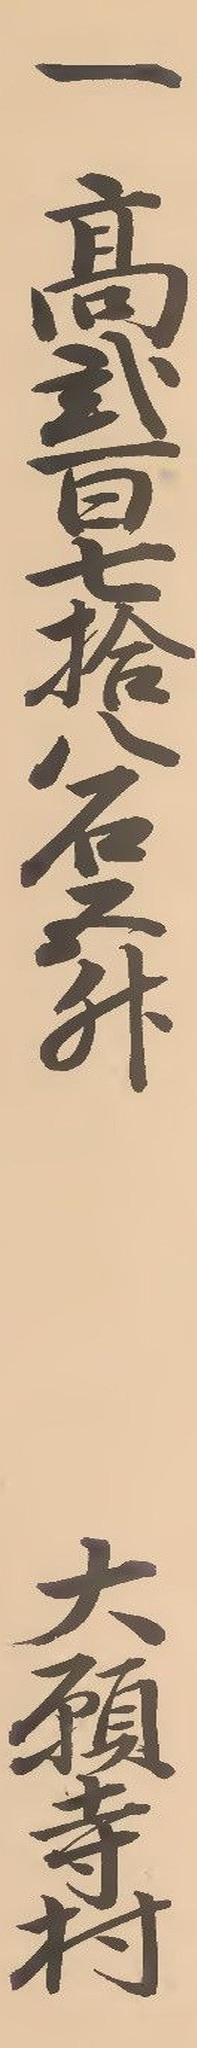一高弐百七拾八石五升大願寺村
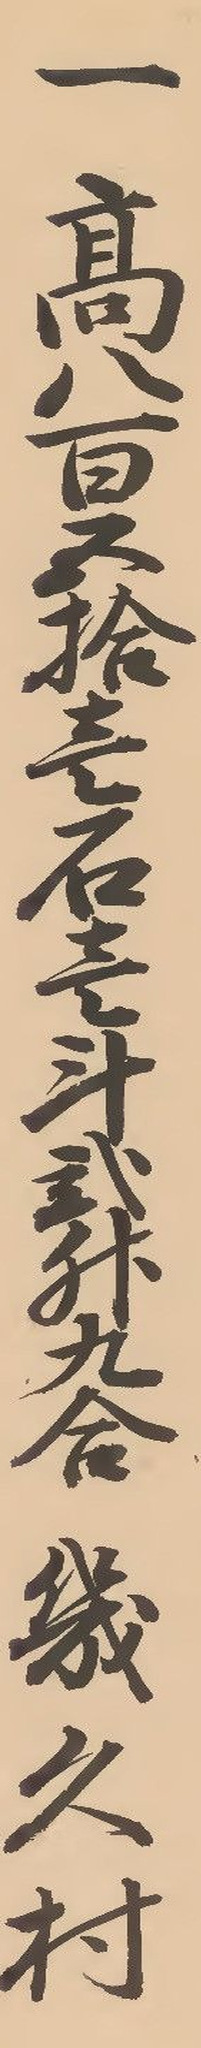一高八百五拾壱石壱斗弐升九合幾久村
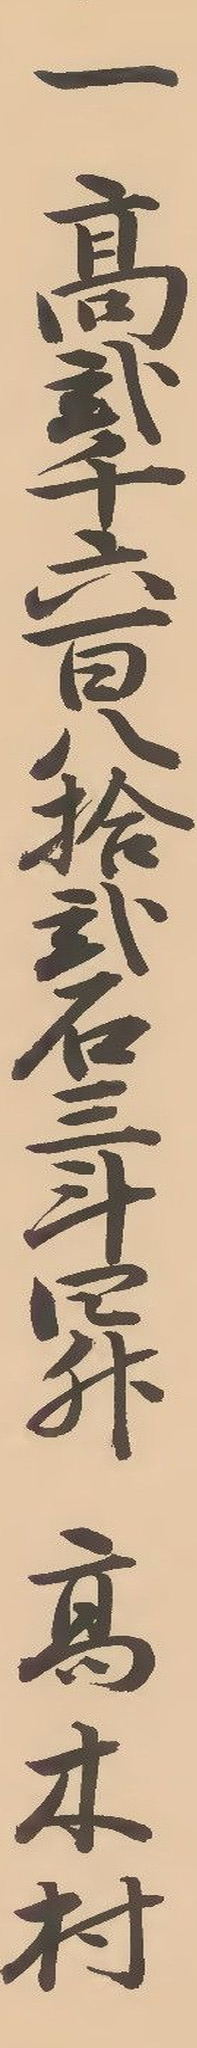一高弐千六百八拾弐石三斗四升高木村
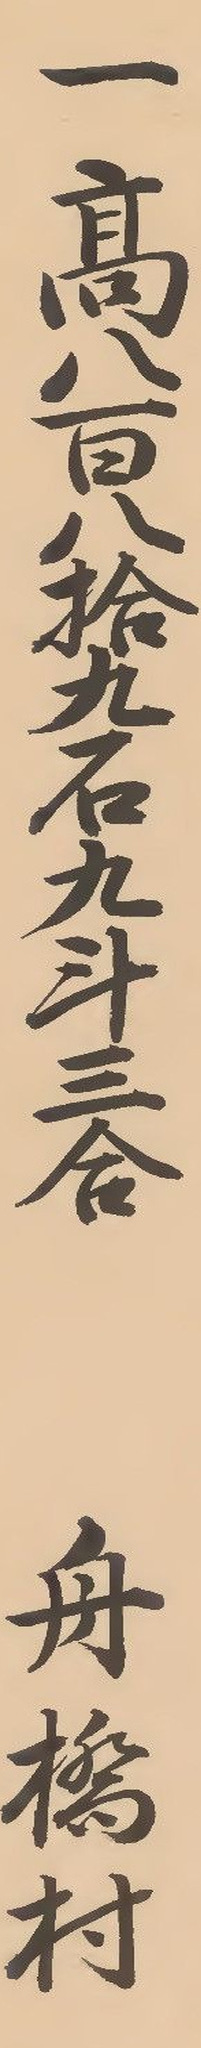一高八百八拾九石九斗三合舟橋村

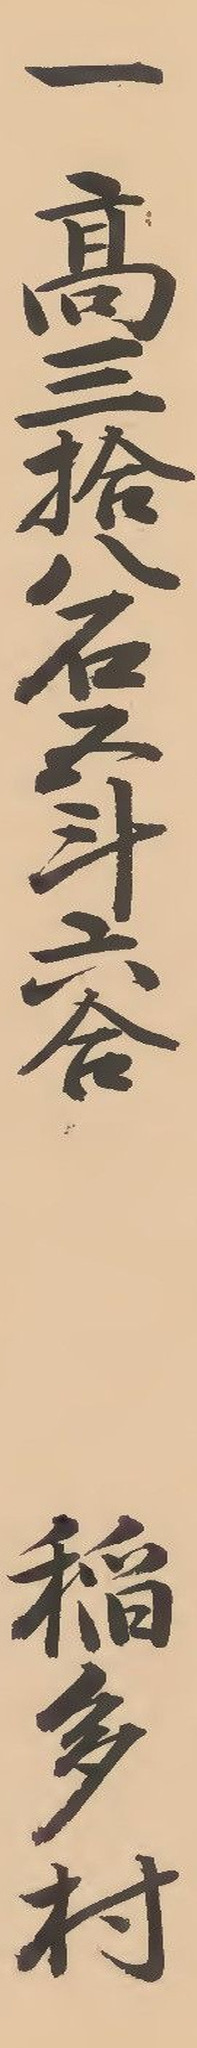一高三拾八石五斗六合稲多村
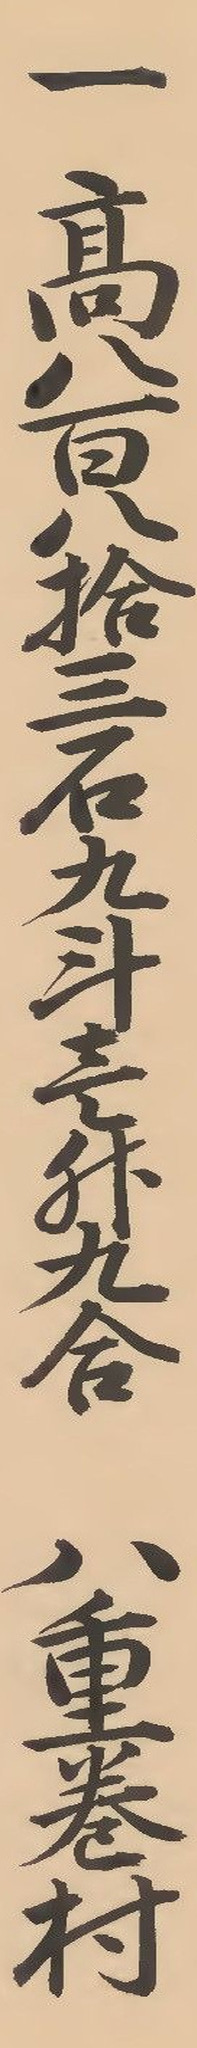一高八百八拾三石九斗壱升九合八重巻村
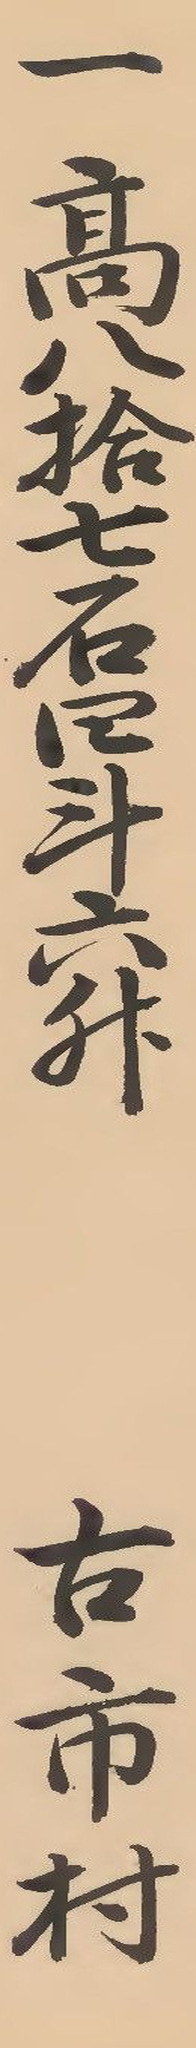一高八拾七石四斗六升古市村
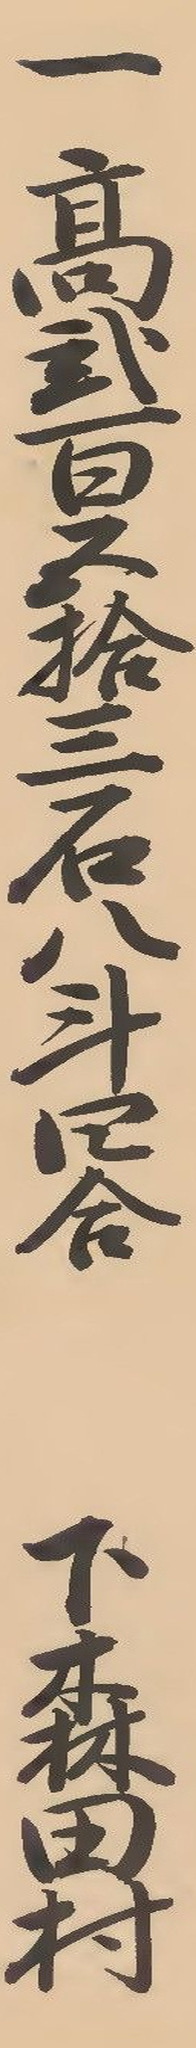一高弐百五拾三石八斗四合下森田村
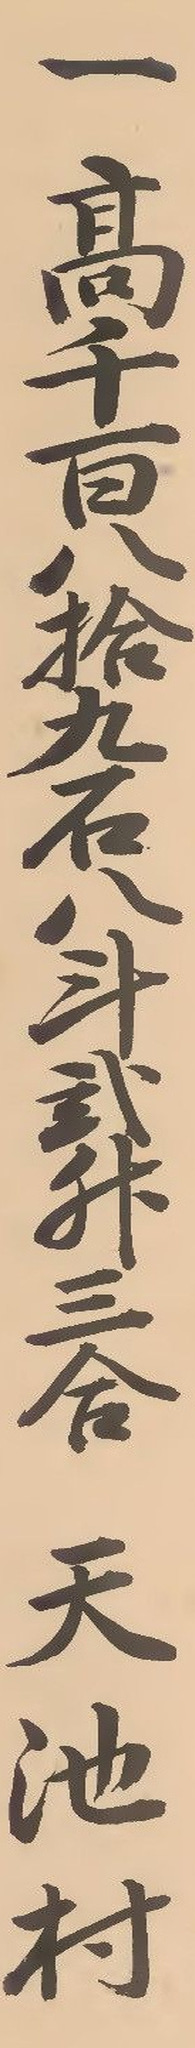一高千百八拾九石八斗弐升三合天池村
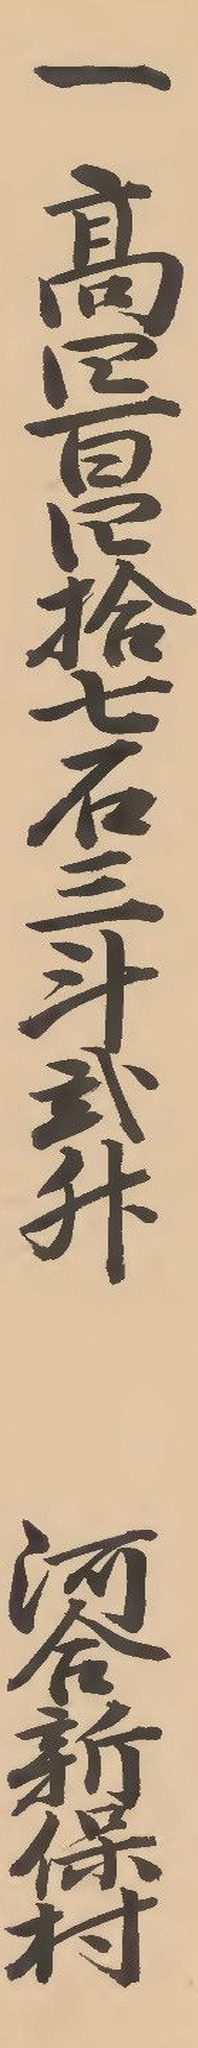一高四百四拾七石三斗弐升河合新保村
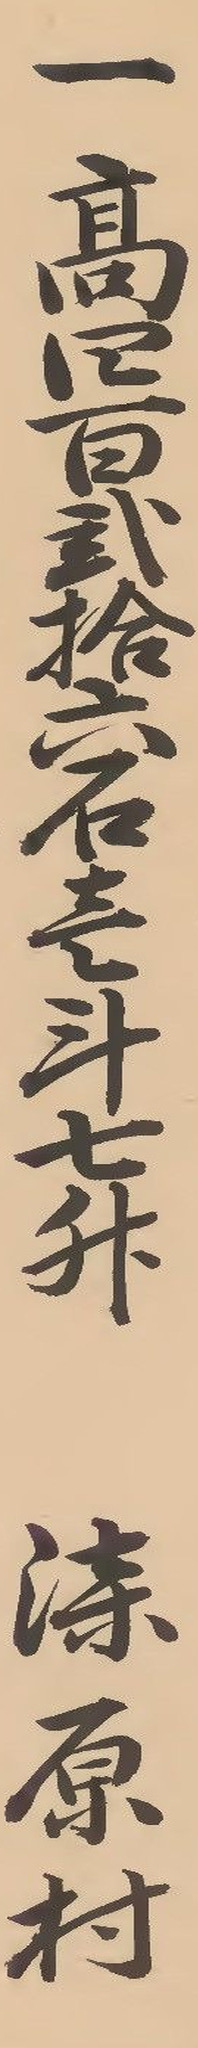一高四百弐拾六石壱斗七升漆原村
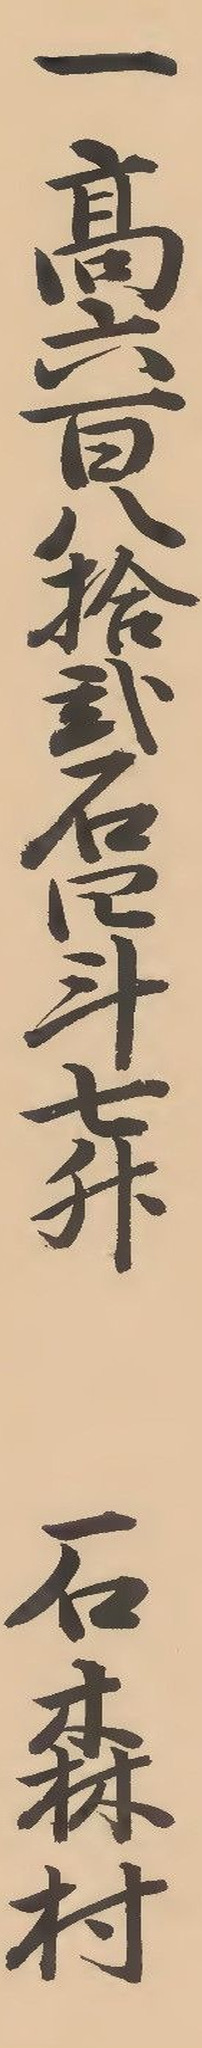一高六百八拾弐石四斗七升石森村

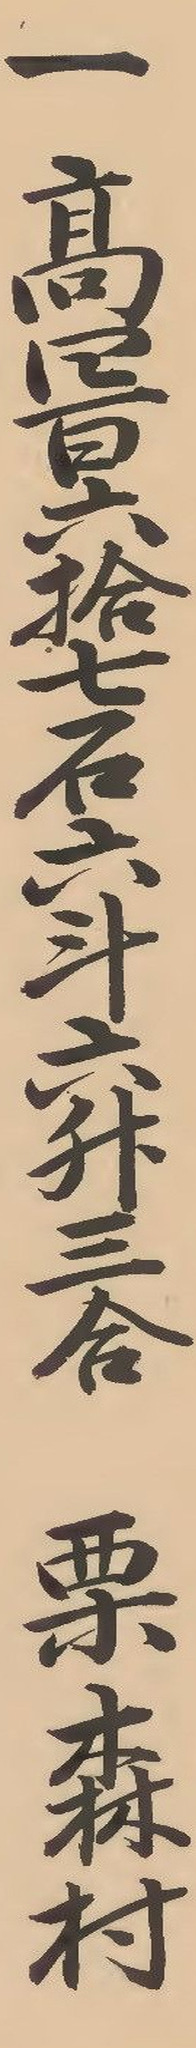一高四百六拾七石六斗六升三合栗森村
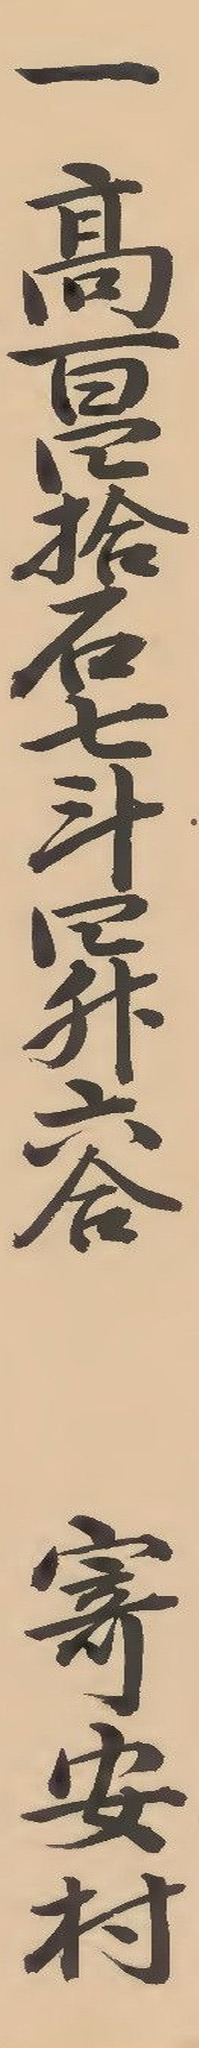一高百四拾石七斗四升六合寄安村
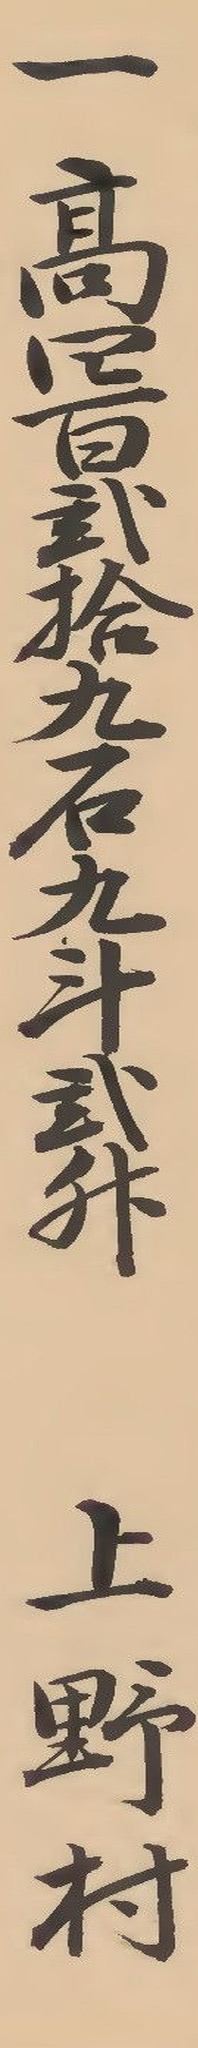一高四百弐拾九石九斗弐升上野村
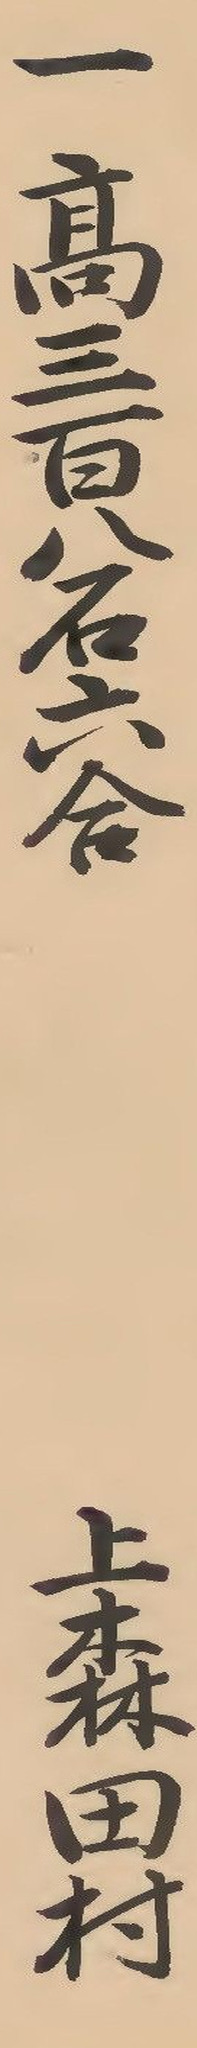一高三百八石六合上森田村
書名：越前国郷帳
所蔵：国立公文書館 National Archives of Japan
